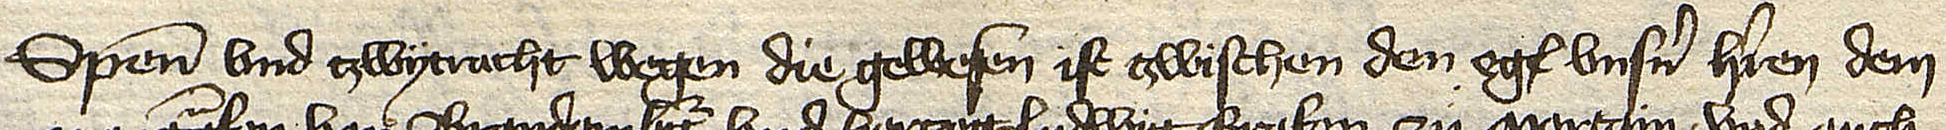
Spen* vnd cʒwytracht wegen die geweſen iſt cʒwiſchen den eg* vnſn* h*ren dem
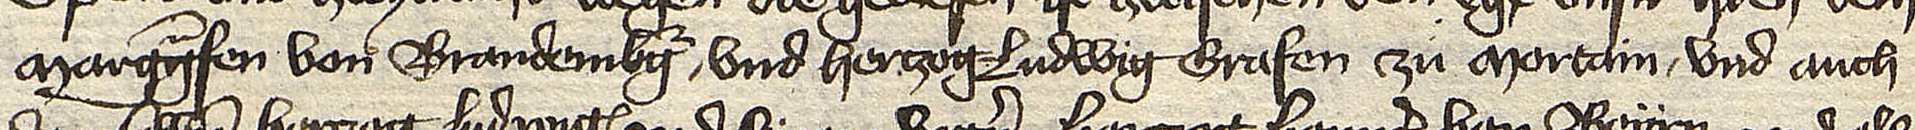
Margg*fen von Brandenb*g / vnd hercʒog Ludwig Grafen cʒü Mortani / vnd auch
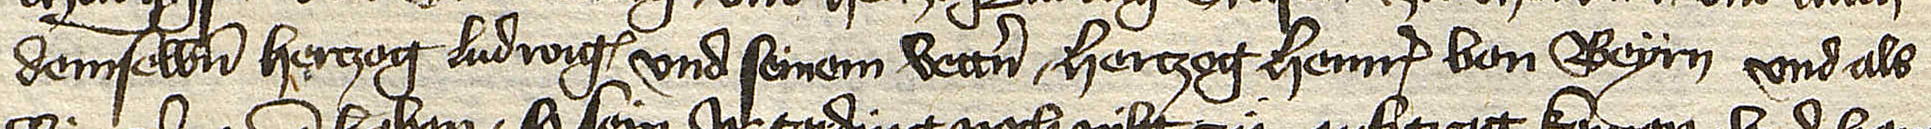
demſelbn* hercʒog ludwig* vnd ſeinem vettn* / Hercʒog Heinr* von Beyrn vnd als
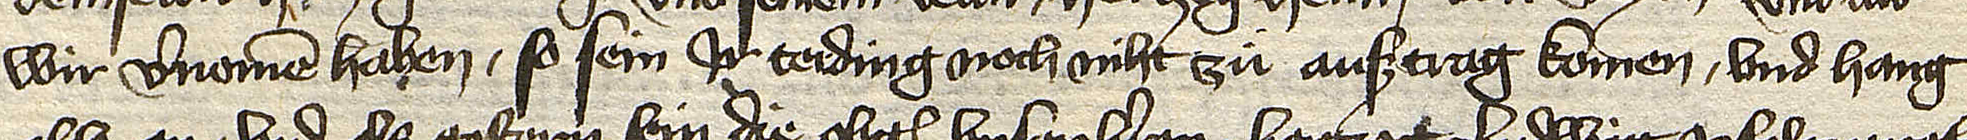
wir v*nome* haben / ſo ſein Ir teiding noch niht cʒü auſʒtrag komen / vnd hang
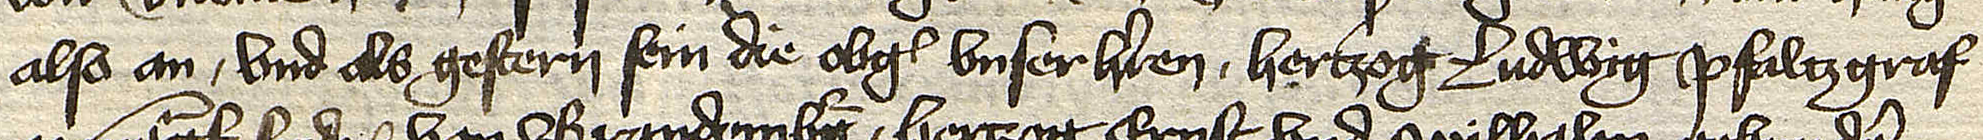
alſo an / vnd als geſtern ſein die obg* vnſer h*ren / hercʒog Ludwig Pfalcʒgraf
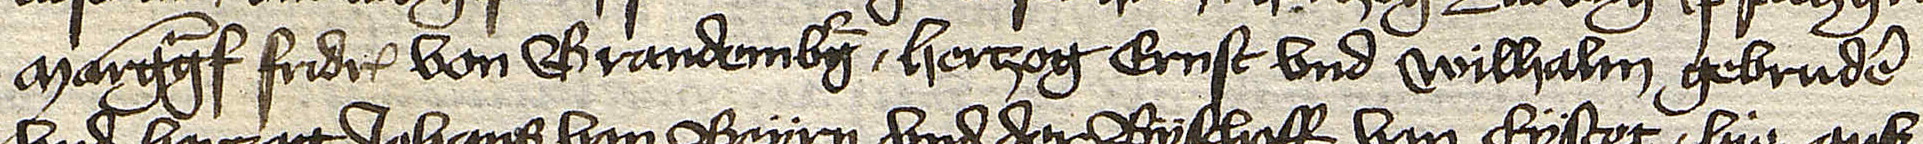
Margg*f fridr* von Brandemb*g / Hercʒog Ernſt vnd wilhalm gebrude*
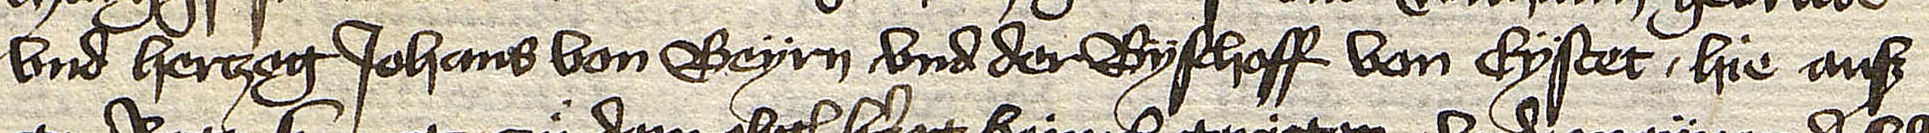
vnd hercʒog Iohans von Beyrn / vnd der Byſchoff von Eyſtet / hie auſʒ
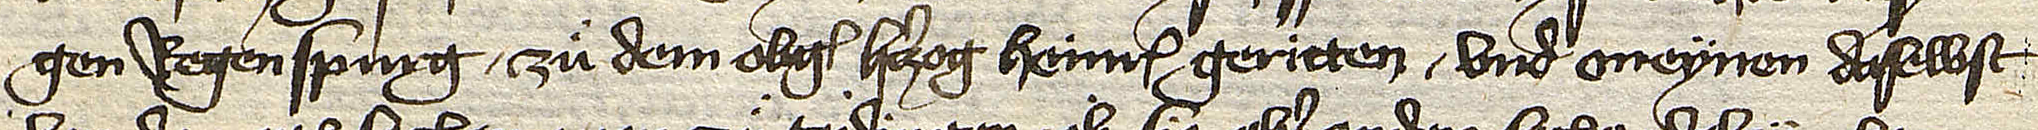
gen Regenſpurg / cʒü dem obg* hcʒog heinr* geritten / vnd meynen daſelbſt
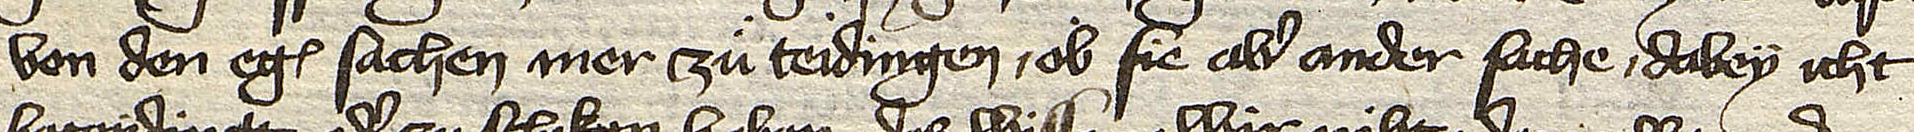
von den eg* ſachen mer cʒü teidingen / ob ſie ab* ander ſache / dabey icht
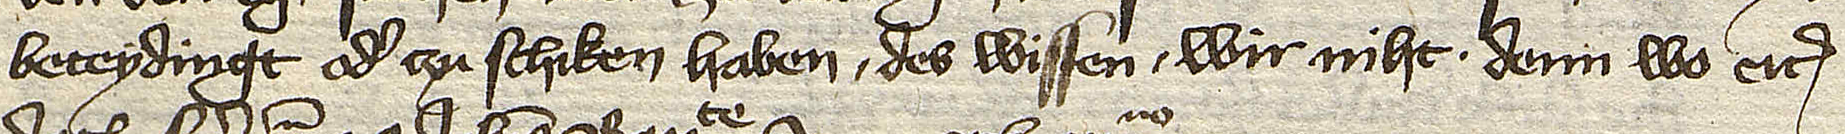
beteydingt od* cʒu ſchiken haben / des wiſſen / wir niht . denn wo ec*
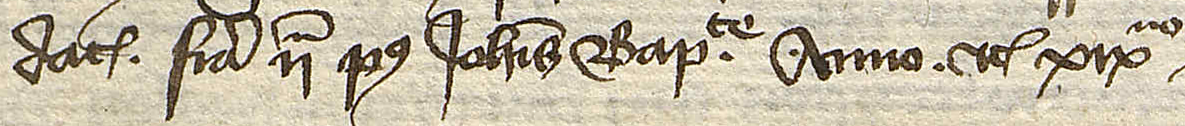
dat* . fia* ii* p* Ioh*is Bap* . Anno . ec* xix* -
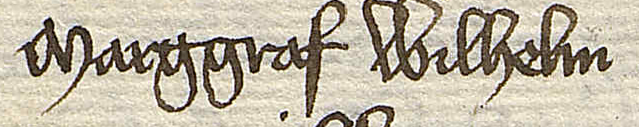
Marggraf Wilhelm
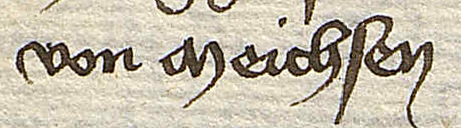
von Meichſen
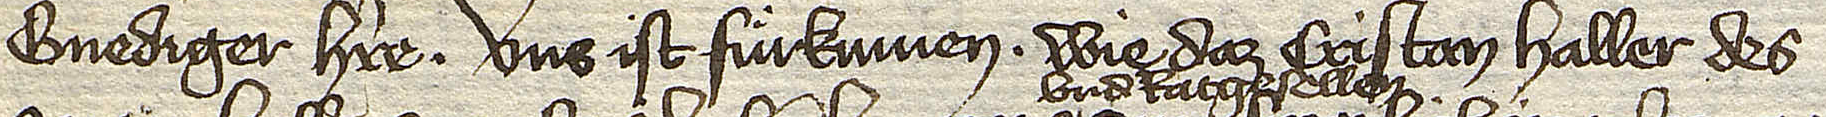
Gnediger h*re . Vns iſt fürkomen . wie daʒ Criſtan haller des
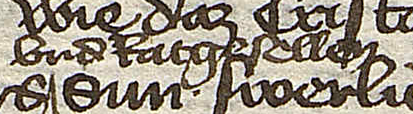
vnd Ratgeſellen
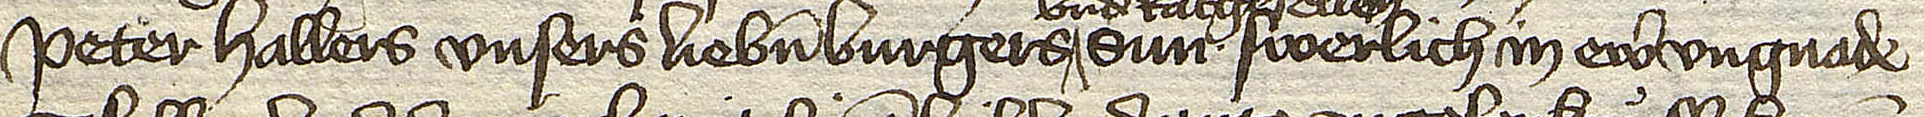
Peter hallers vnſers liebn* burgers Sun ſwerlich in ew* vngnade
